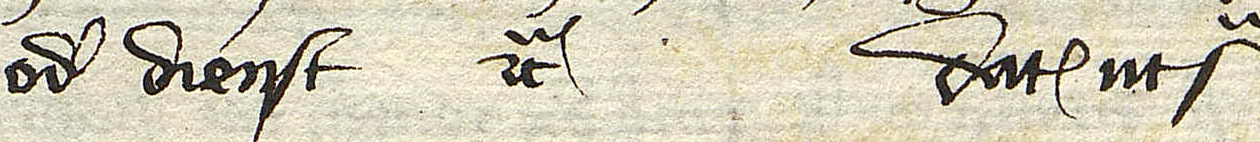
od* dienſt ec* Dat* ut ſ*
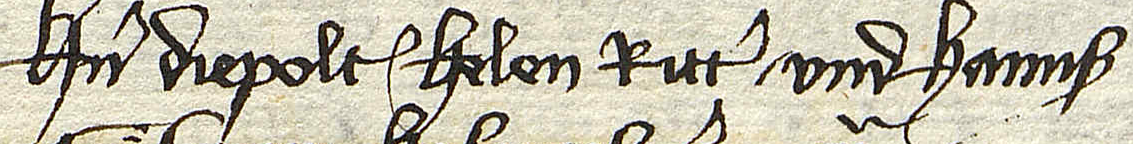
H*n Diepolt* Helen Ritt* / vnd Hannſ*
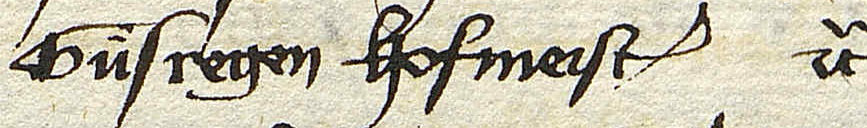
Güſregen hofmeiſt* ec*
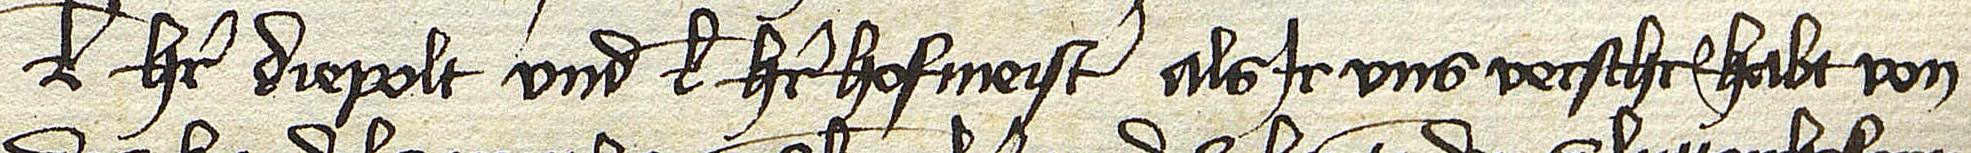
L* h*r diepolt vnd l* h*r hofmeiſt* als Ir vns verſchr* habt von
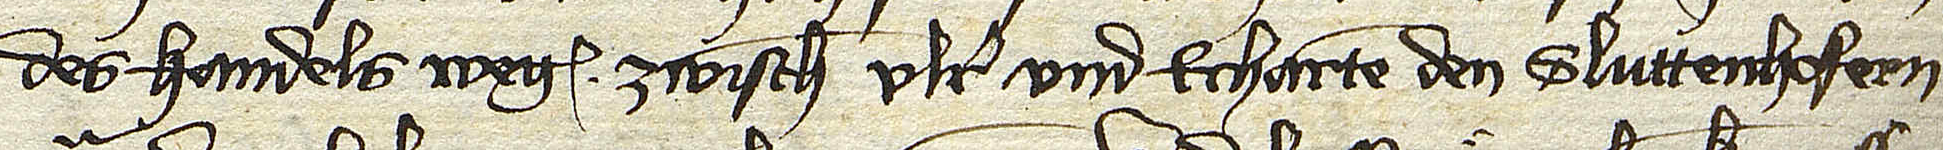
des handels weg* . ʒwiſch* vlr* vnd Erharte* den Sluttenhofern
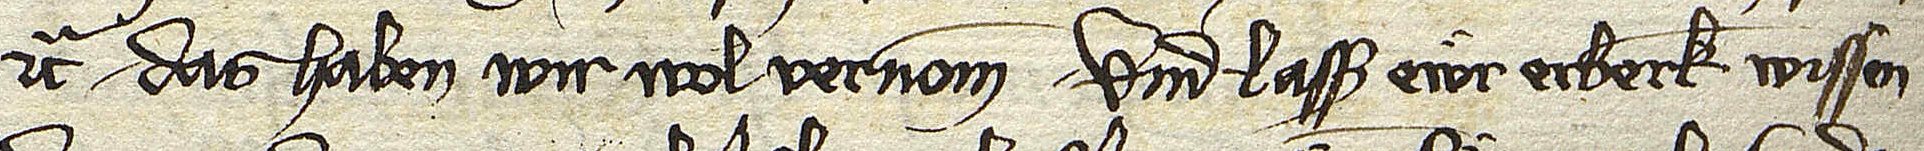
ec* / Das haben wir wol vernom* / Vnd laſſ* ewr erberk* wiſſen
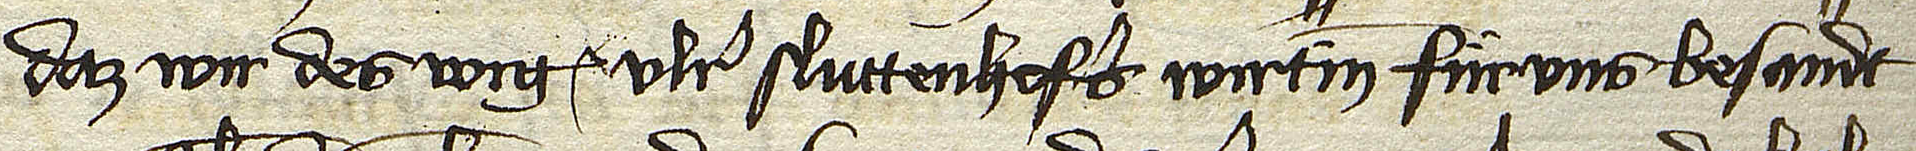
daʒ wir des vorg* vlr* ſluttenhof*s wirtin* für vns beſandt
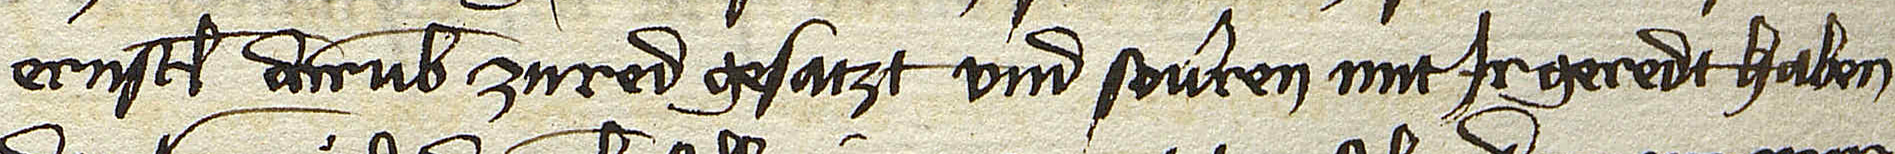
ernſtl* daru*b ʒured geſacʒt vnd ſou*ren mit Ir geredt haben
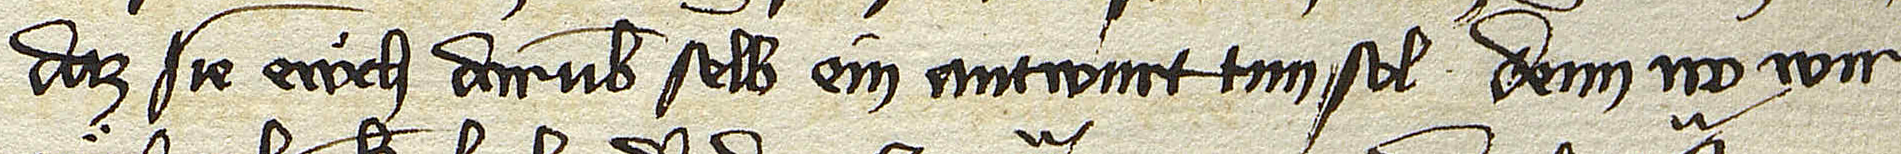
daʒ ſie ewch daru*b ſelb ein antwurt tun ſol . Denn wo wir
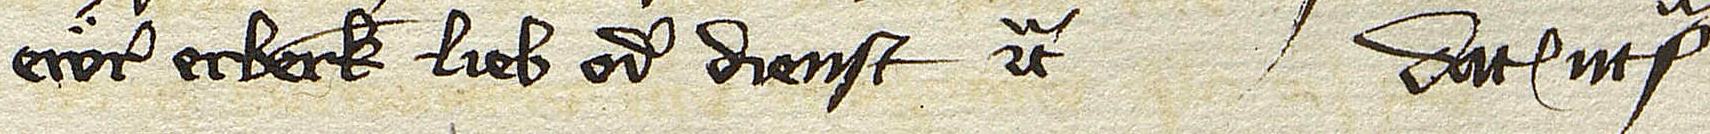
ew*r erberk* lieb od* dienſt ec* Dat* ut ſ*
